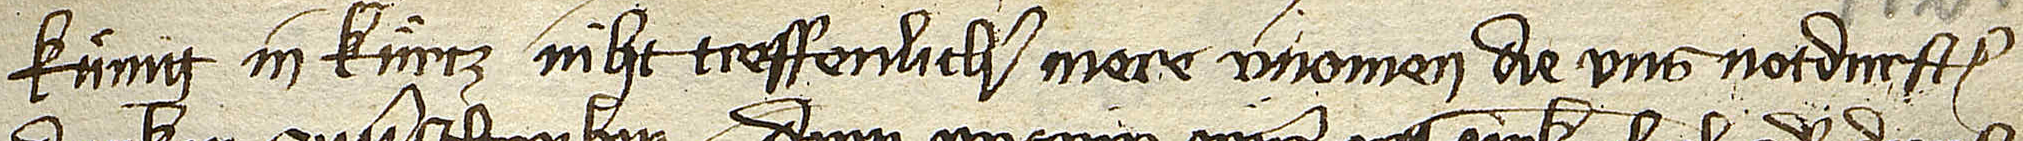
künig in kürcʒ / niht treffenlich* mere v*nomen die vns notdurft*
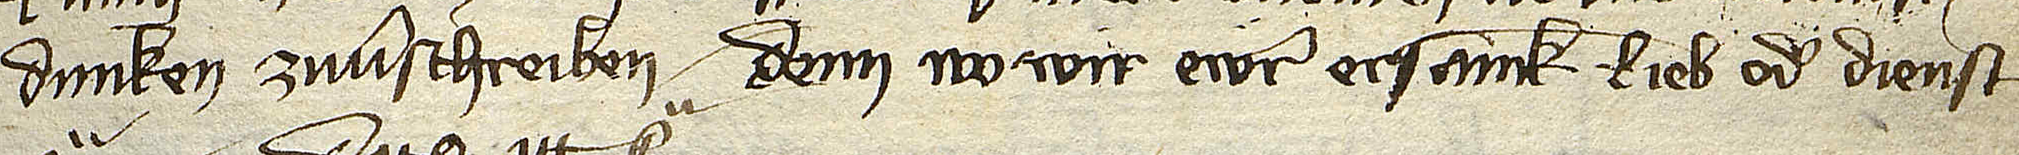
dunken ʒuu*ſchreiben / Denn wo wir ewr* erſamk* lieb od* dienſt
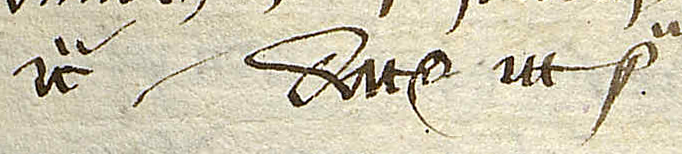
ec* / Dat* ut ſ*
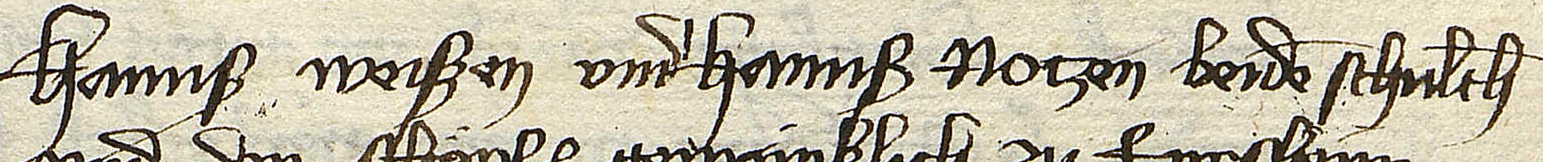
Hannſ* weiſʒen vnd hannſ* Nocʒen beide* ſchulth*
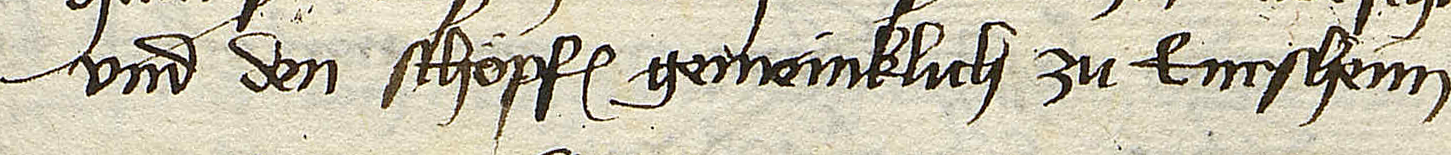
vnd den ſchöpf* gemeinklich ʒu Enrſheim
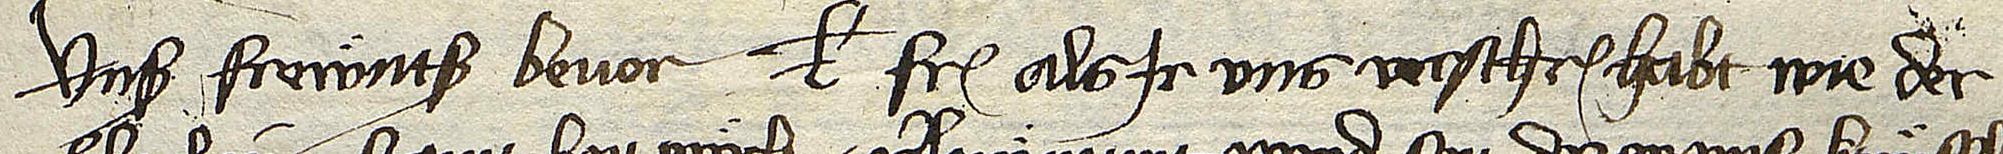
Vnſ* frewntſ* beuor L* fr* als Ir vns verſchr* habt wie der
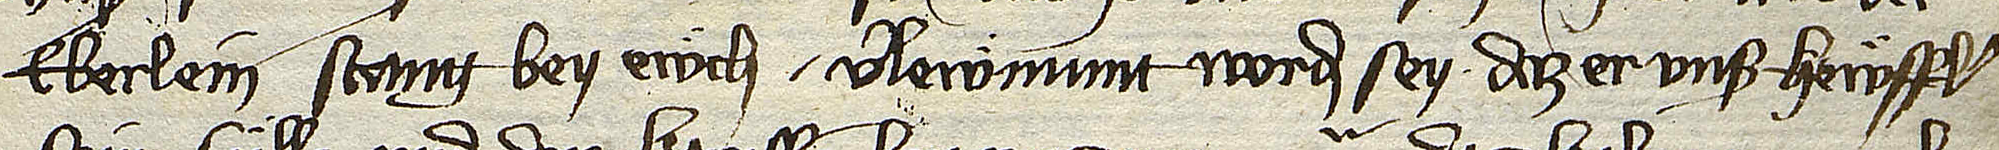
Eberlein ſtang bey ewch / v*lewmunt word* ſey . daʒ er vnſ* hewffl*
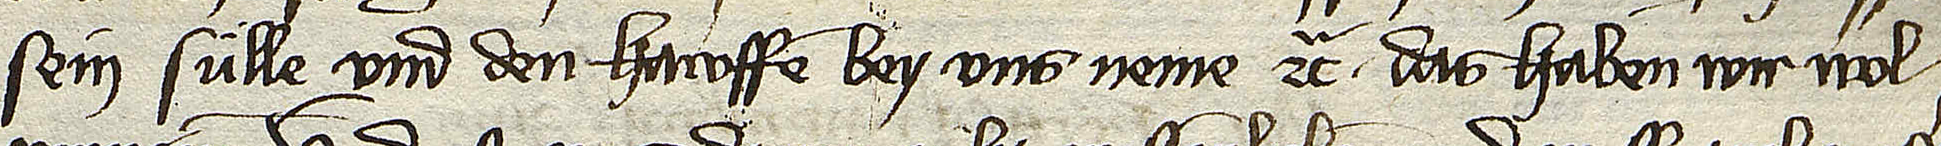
ſein ſülle vnd den Hawffe* bey vns neme ec* / das haben wir wol
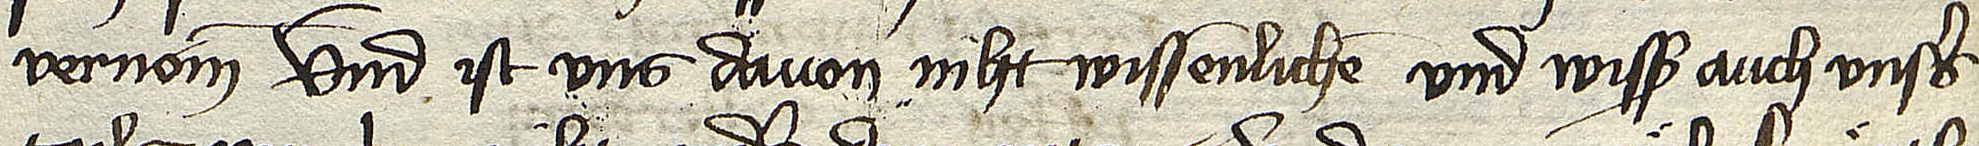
vernom* Vnd ist vns dauon niht wiſſenliche* vnd wiſſ* auch vnſ*s
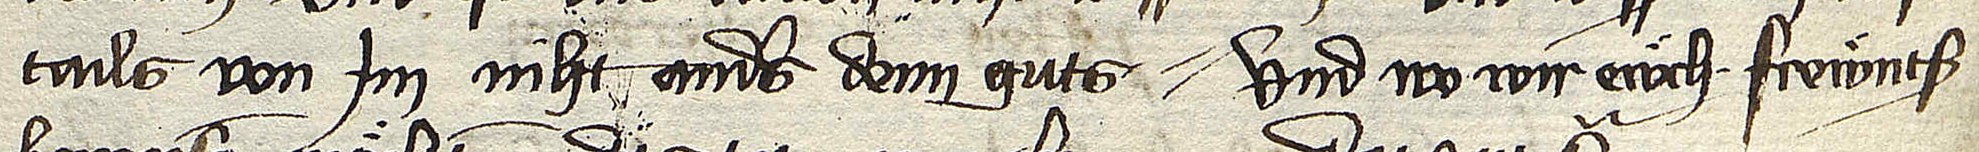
tails von Im niht and*s denn guts / / Vnd wo wir ewch frewntſ*
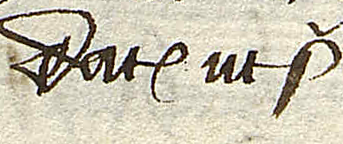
Dat* ut ſ*
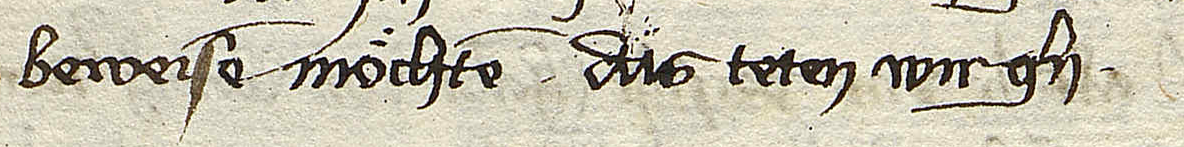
beweiſe* möhte* . das teten wir g*n
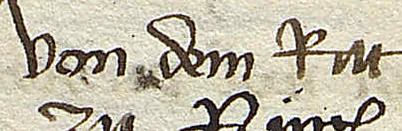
Von dem Rat
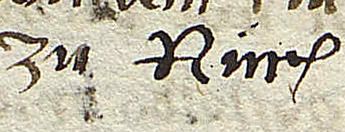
ʒu Nür*
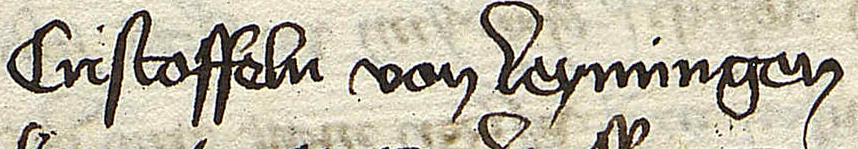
Criſtoffeln von Leymingen
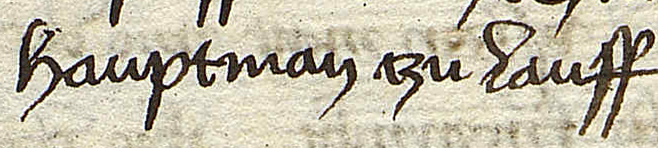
hauptman cʒu Lauff
